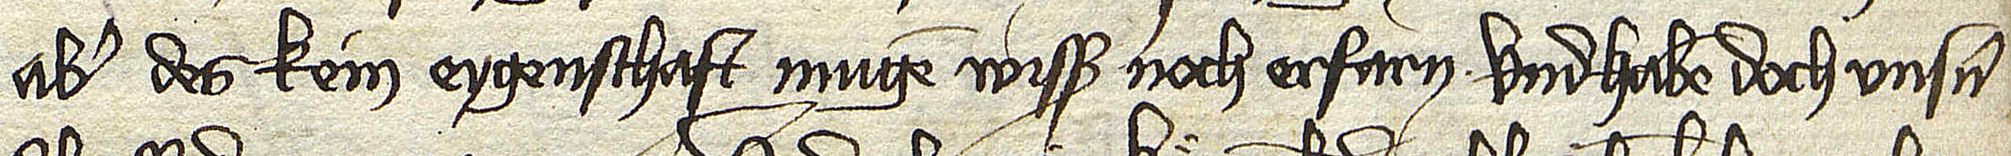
ab* des kein eygenſchaft muge* wiſſ* noch erfarn . Vnd habe* doch vnſ*n
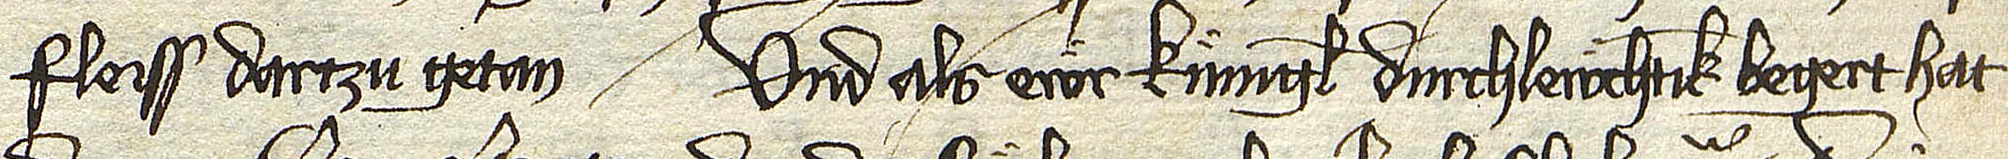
fleiſſ darcʒu getan / Vnd als ewr künigl* durchlewchtik* begert hat
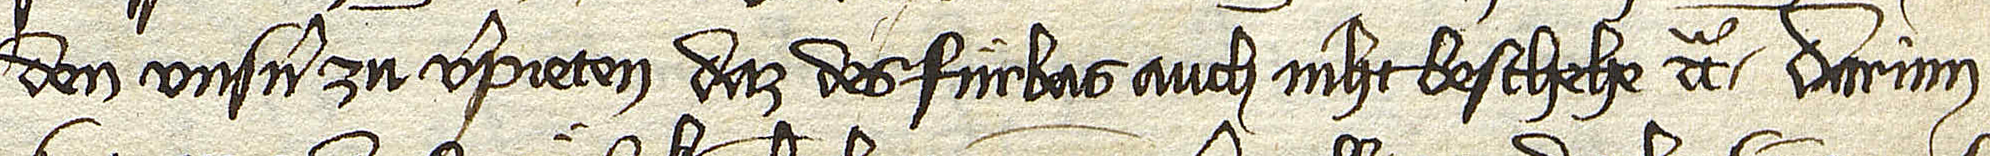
den vnſ*n ʒu v*pieten daʒ des fürbas auch niht beſchehe ec* / Darinn
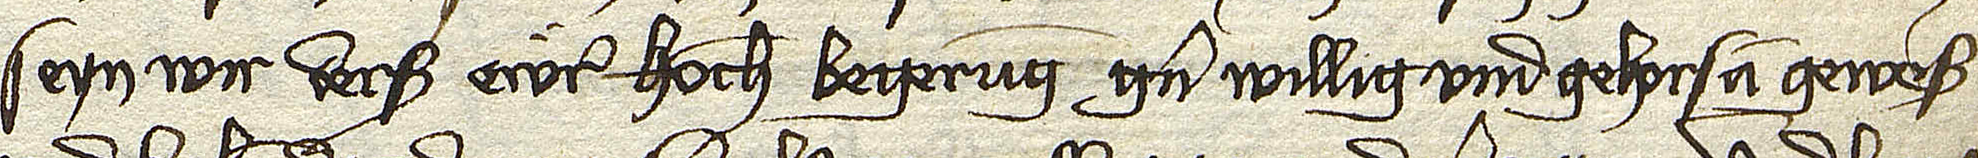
ſeyn wir derſ* ew*r hoch* begeru*g g*n willig vnd gehorſa* geweſ*
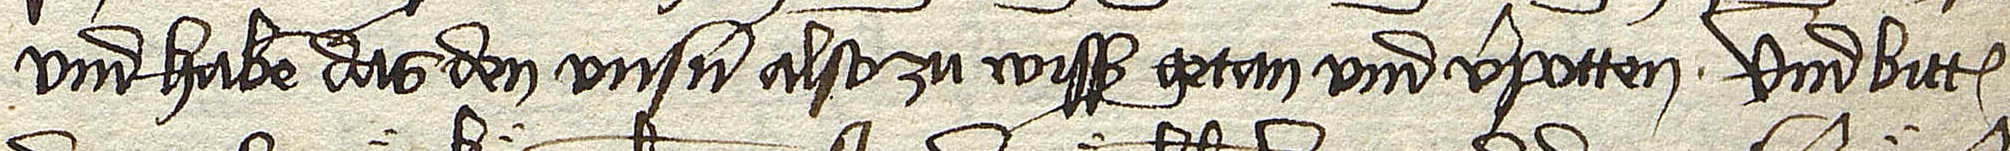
vnd habe* das den vnſ*n alſo ʒu wiſſ* getan vnd v*potten . Vnd bitt*
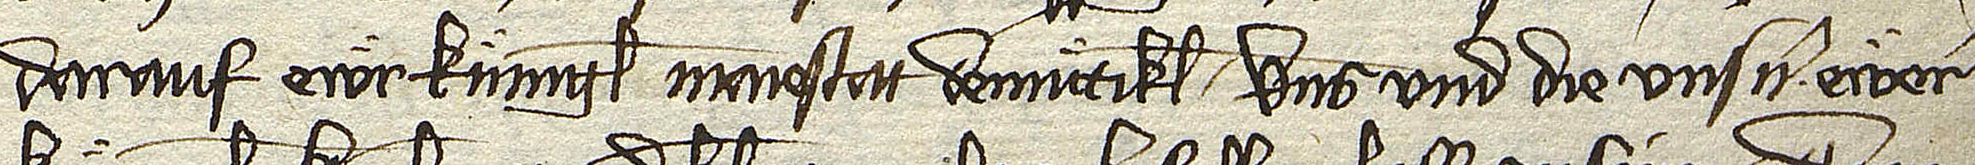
darauf ewr künigl* maieſtat demütikl* / Vns vnd die vnſ*n . ewer*
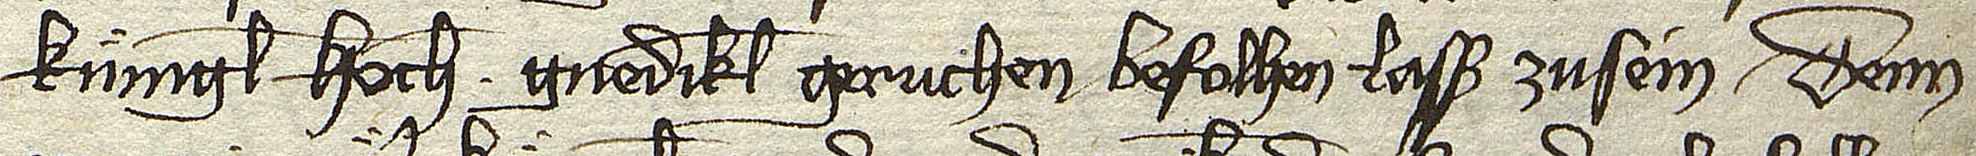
künigl* hoch* . gnedikl* geruchen befolhen laſſ* ʒu ſein / Denn
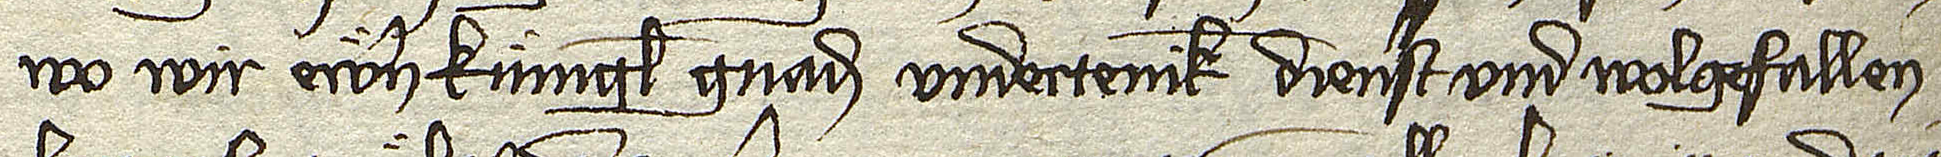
wo wir ew*n künigl* gnad* vndertenik* dienſt vnd wolgefallen
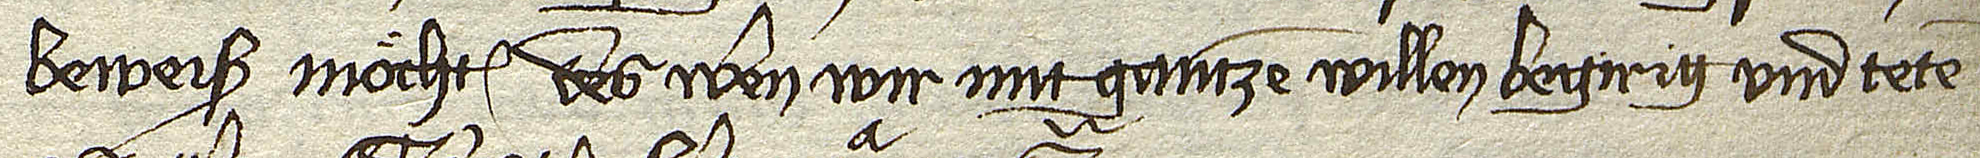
beweiſ* möcht* Des we*n wir mit gancʒe* willen begirig vnd tete*
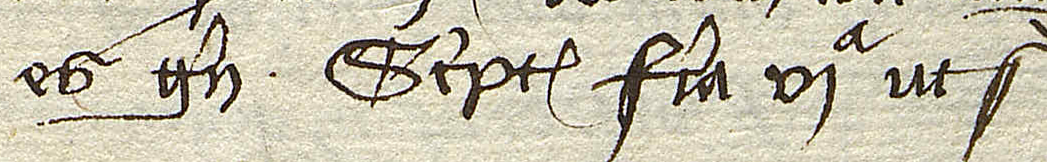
es g*n . Sc*pt* fia* vi* ut ſ*
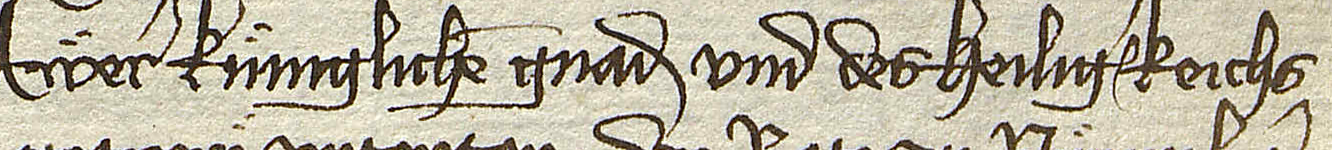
Ewer* künigliche* gnad* vnd des heilig* Reichs
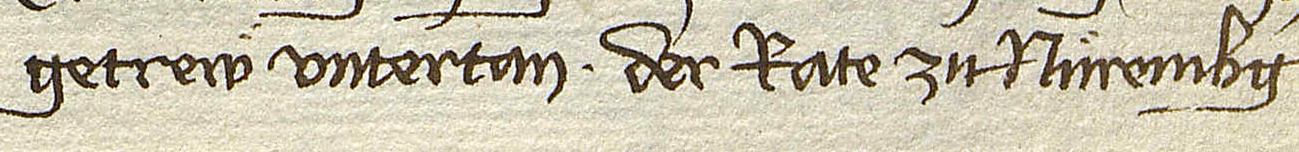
getrew vntertan . der Rate ʒu Nüremb*g
